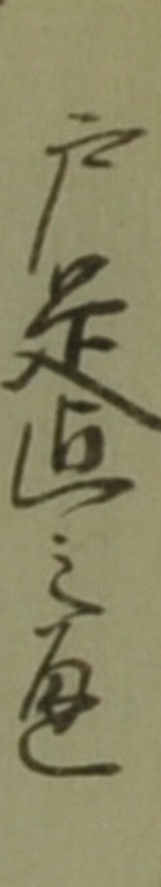戸是迄之通
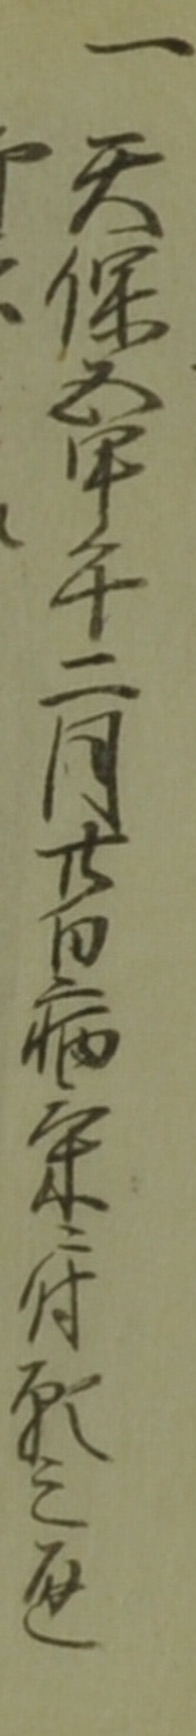一天保五甲午二月廿日病気ニ付願之通
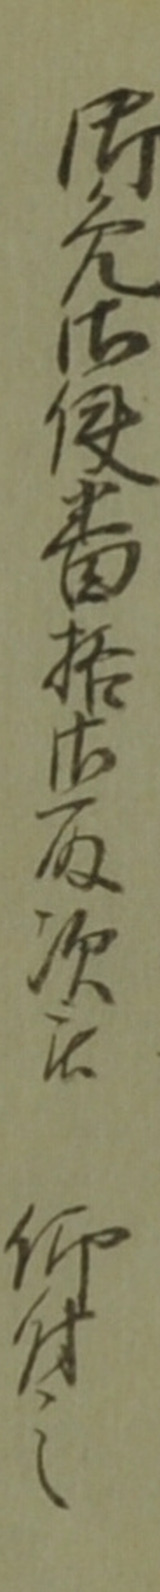御免御使番格御取次被仰付之
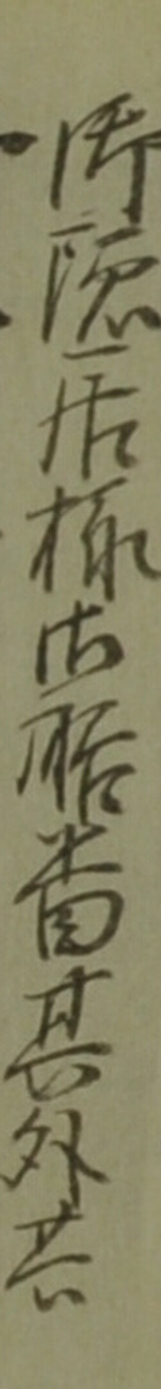御隠居様御膳番其外共
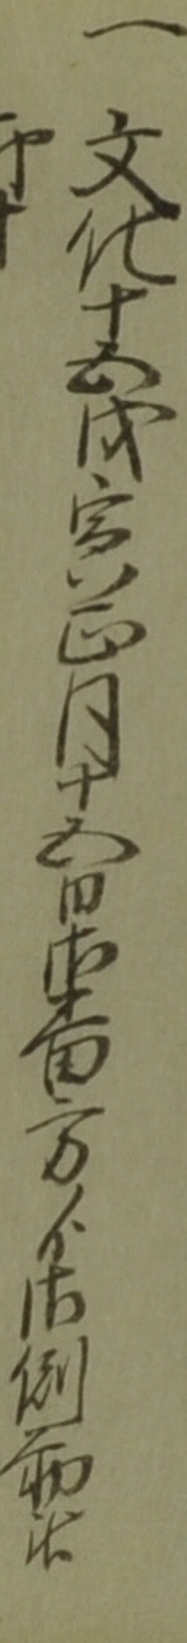一文化十五戊寅正月十五日御番方ゟ御側勤被
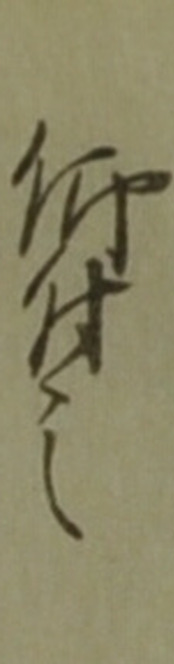仰付之
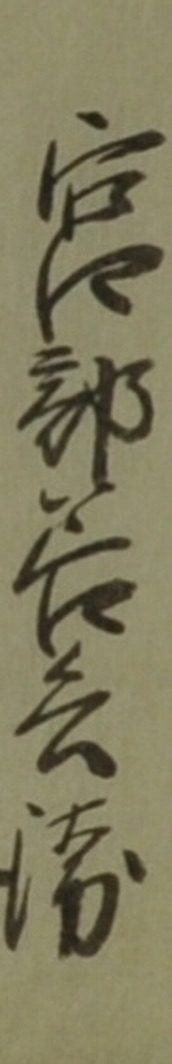宮部善兵衛
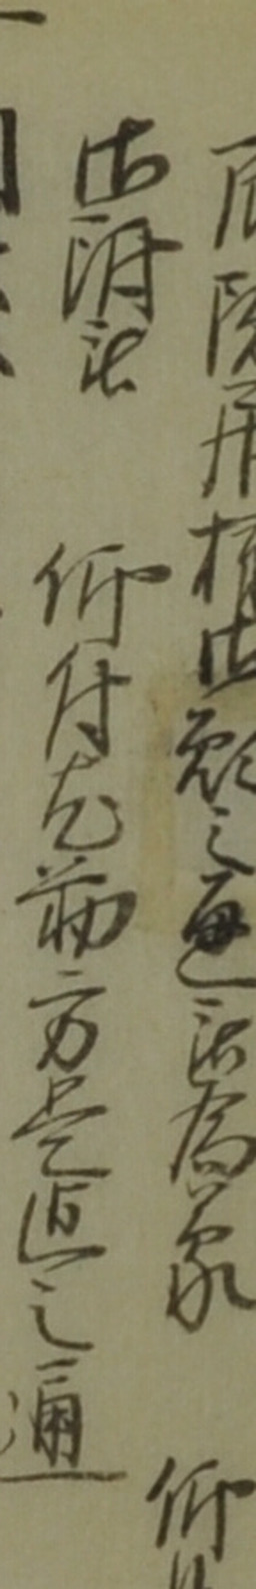御附被仰付尤勤方是迄之通
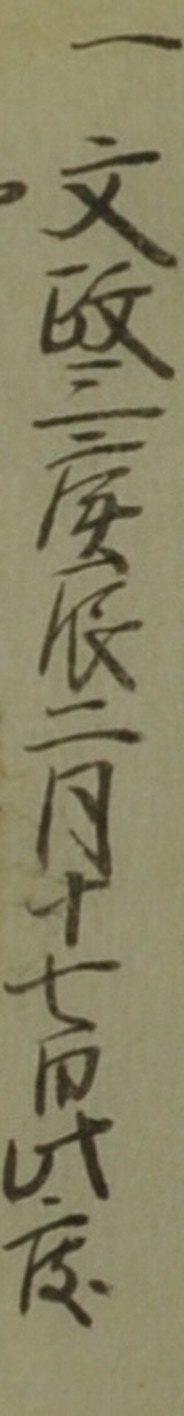一文政三庚辰二月十七日此度
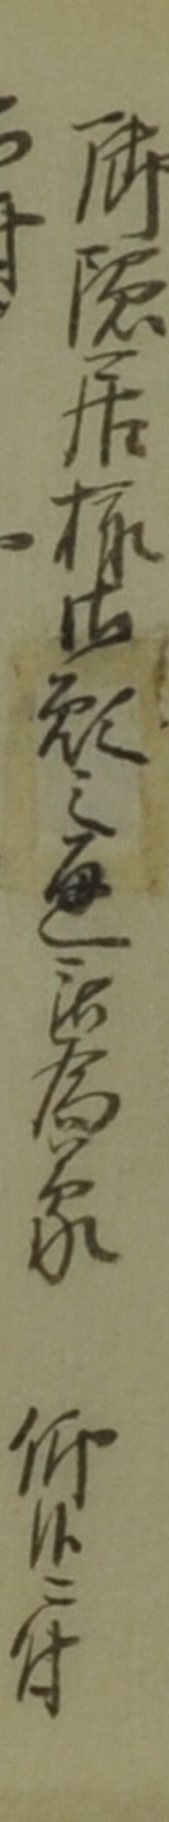御隠居様御願之通被為蒙仰候ニ付
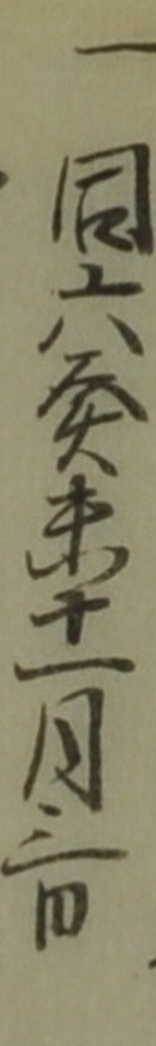一同六癸未十一月三日
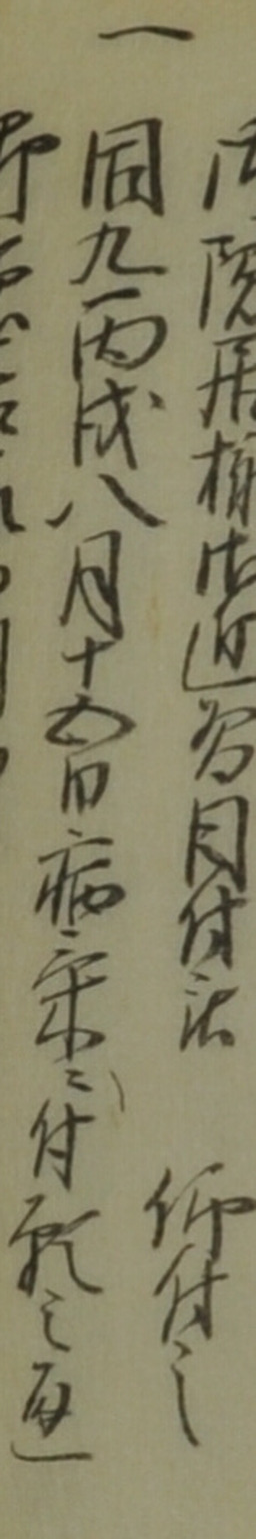一同九丙戌八月十五日病気ニ付願之通
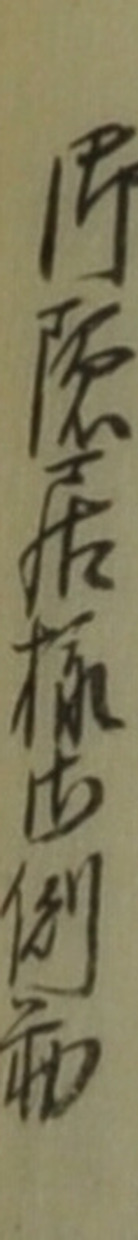御隠居様御側勤
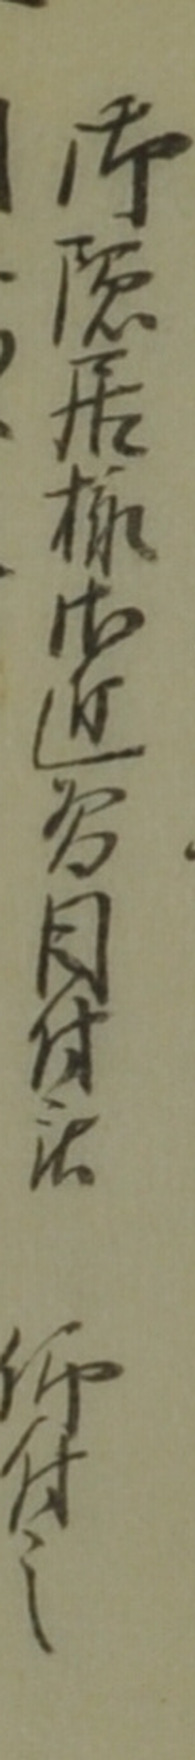御隠居様御近習目付被仰付之
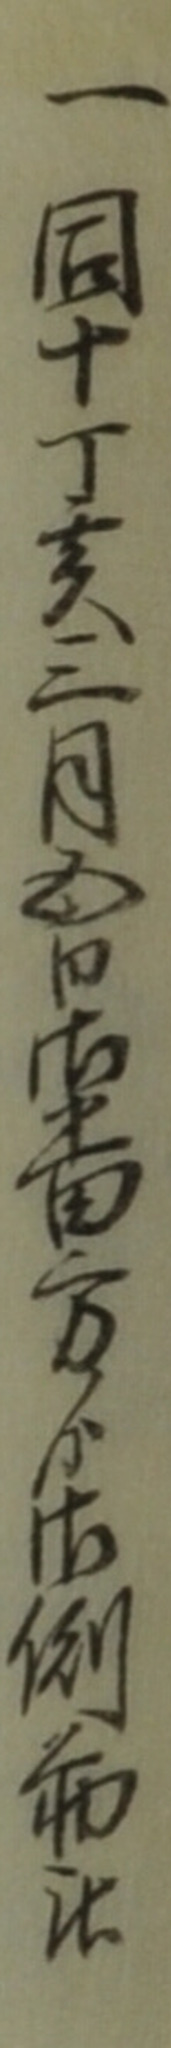一同十丁亥三月五日御番方ゟ御側勤被
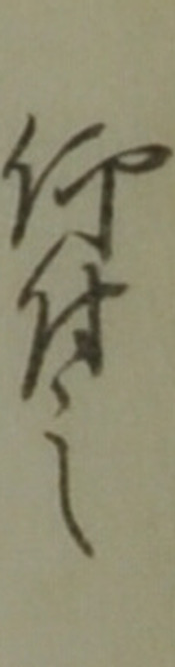仰付之
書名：諸御役代々録（五）
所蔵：伊那市立高遠町図書館・合同会社AMANE
